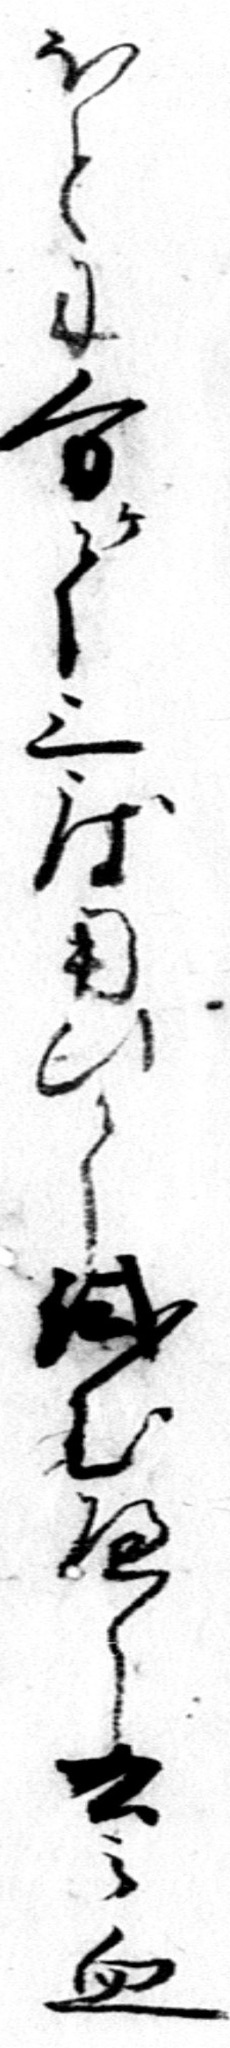ほとに分けて三度用ひて試むへし右の血
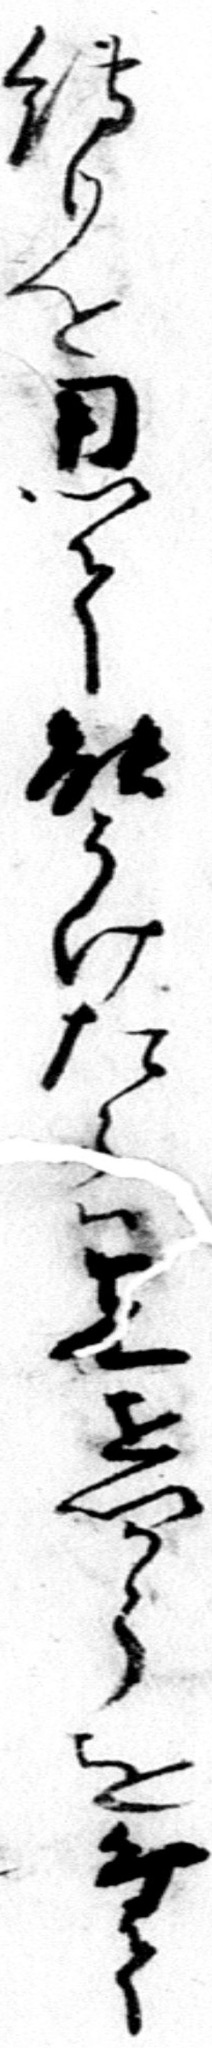縛りを用いて能うけたらは先せいかうを付て
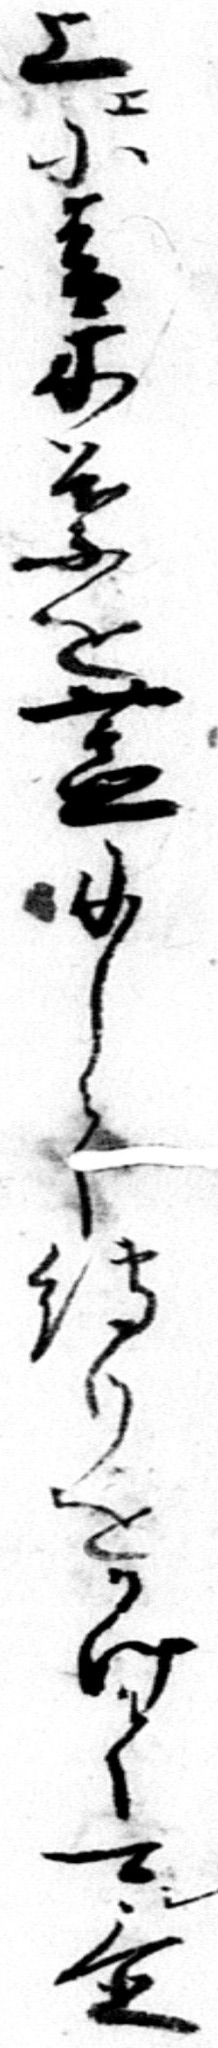上えに青木葉を蓋にして縛りをかけて可置
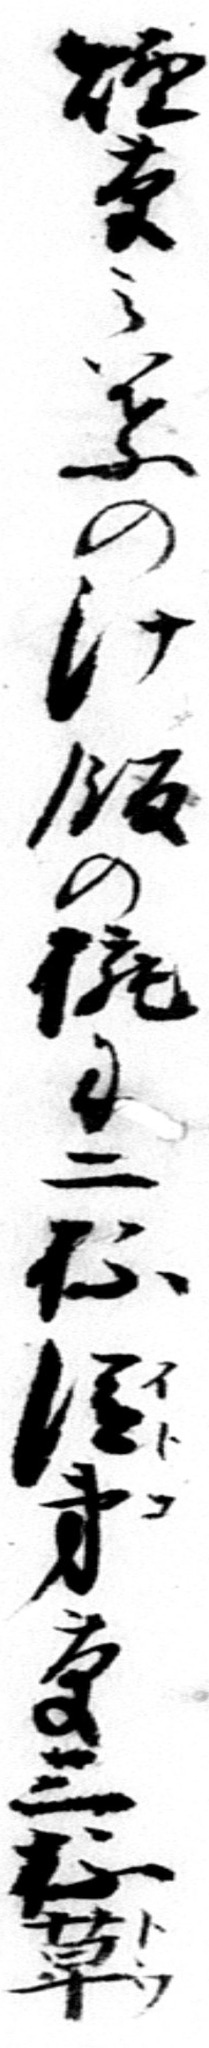煙草の葉の汁飯の椀に二杯従弟草三杯草
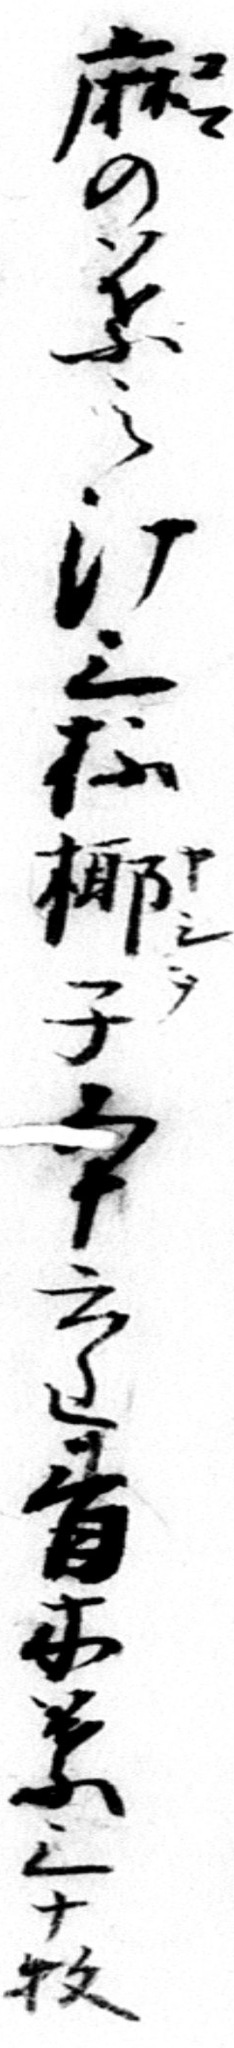麻の葉の汁三杯椰子五十六匁青木葉三十枚
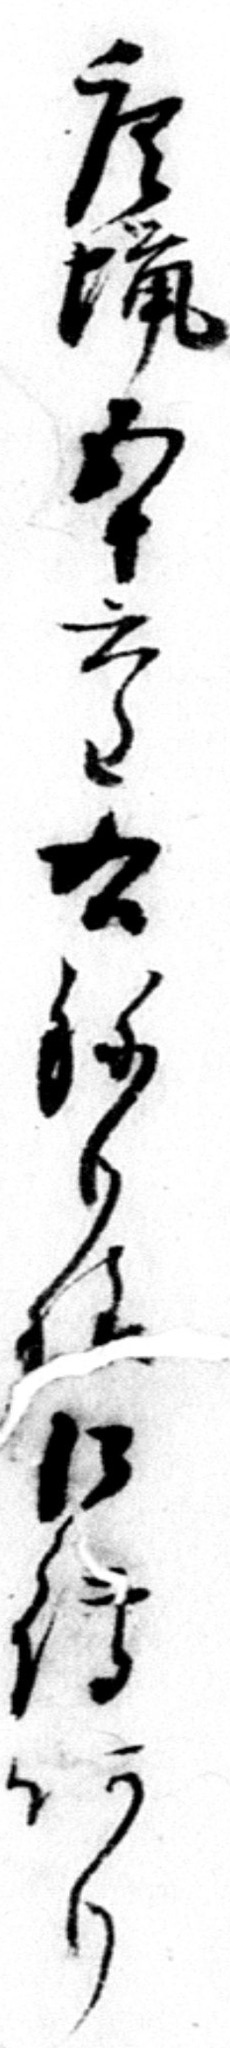唐蝋五十六匁右ねり様口伝あり
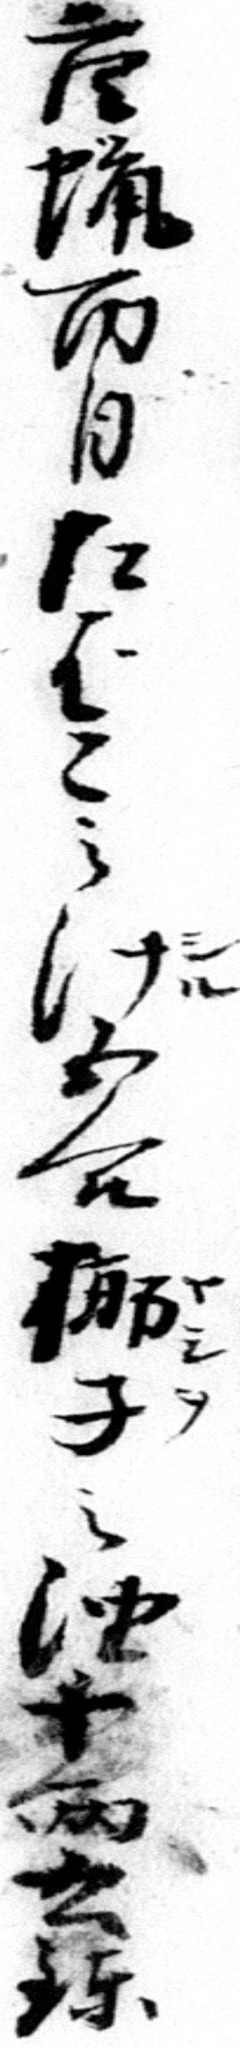唐蝋百目たばこの汁五合椰子の油十両右錬
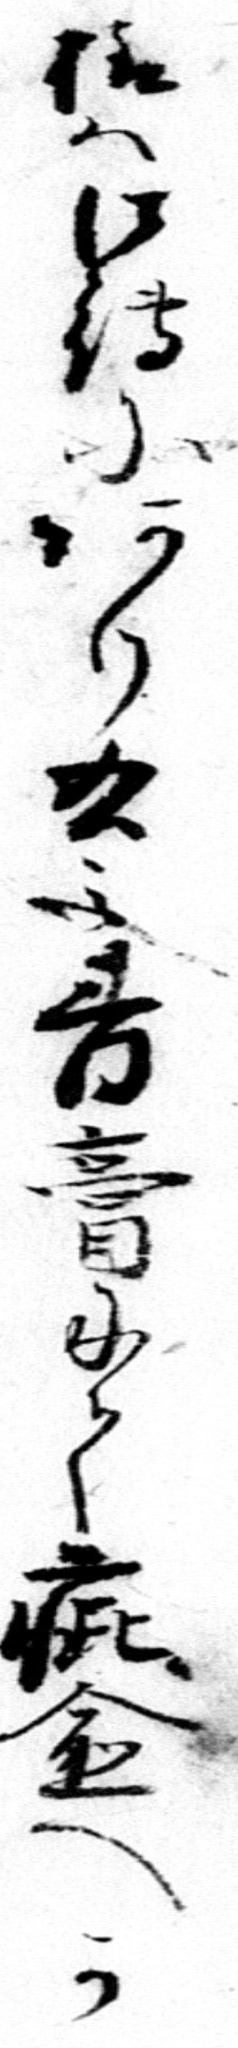様は口伝にあり右の青膏にて疵愈へか
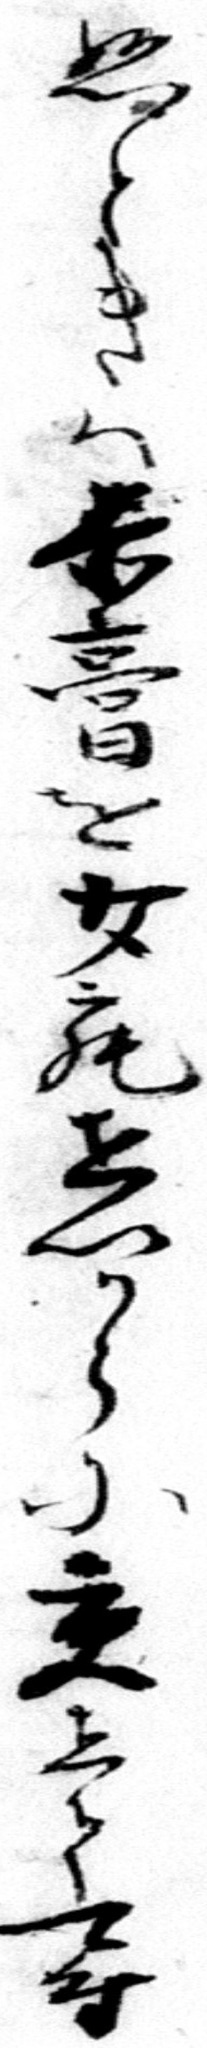ぬときは赤膏を少宛せいかうに交して可付
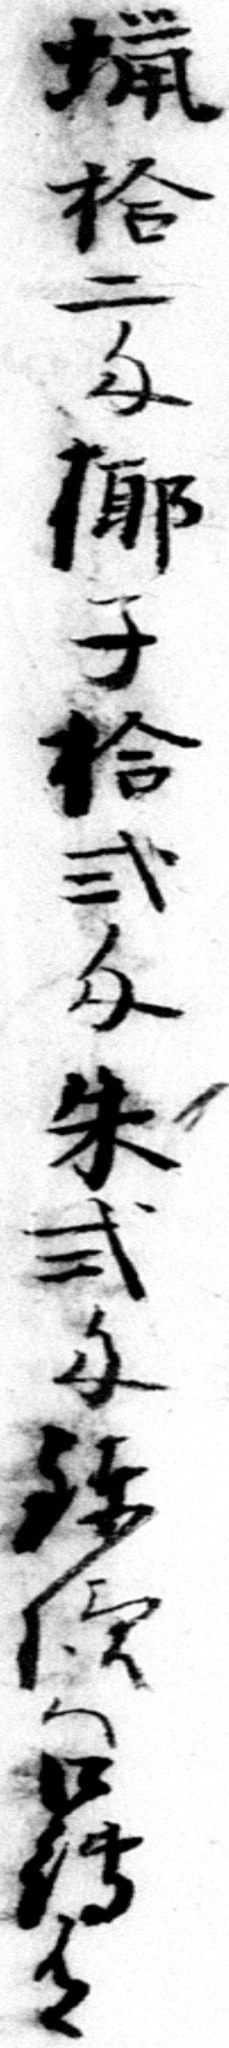蝋拾二匁椰子拾弍匁朱弍匁錬様は口伝有
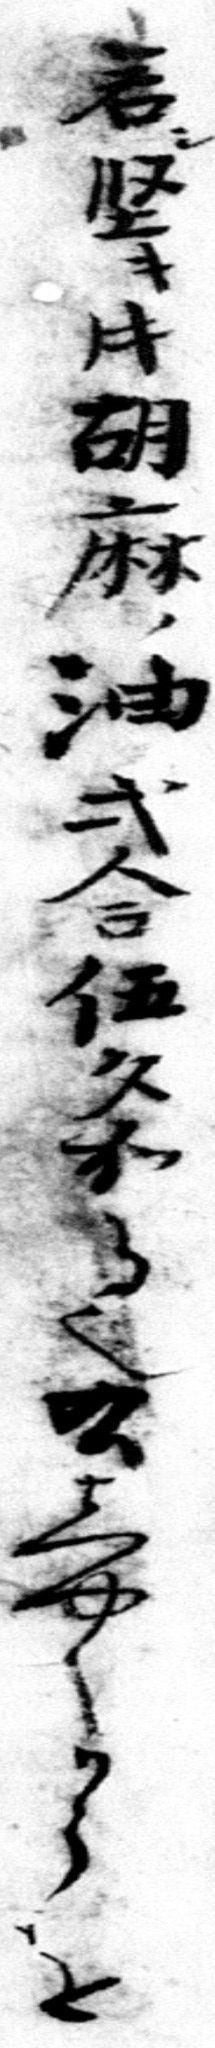若し堅きとき胡麻の油弍合伍勺加る也右しやくかうを

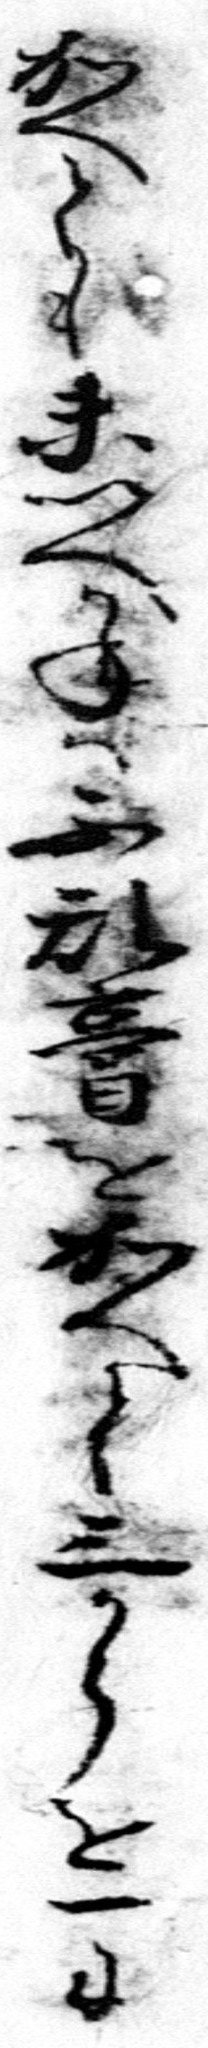加へても未いへかねは不乱膏を加へて三かうを一に
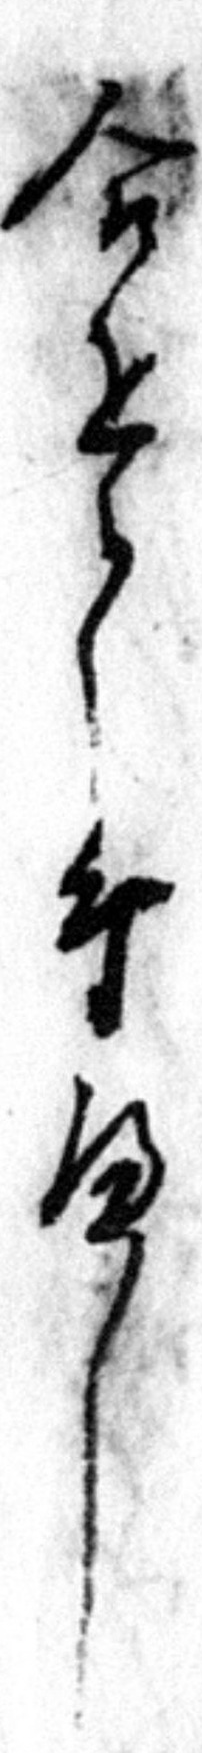合せて付へし
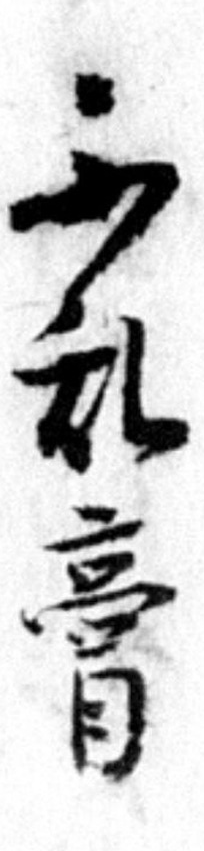不乱膏
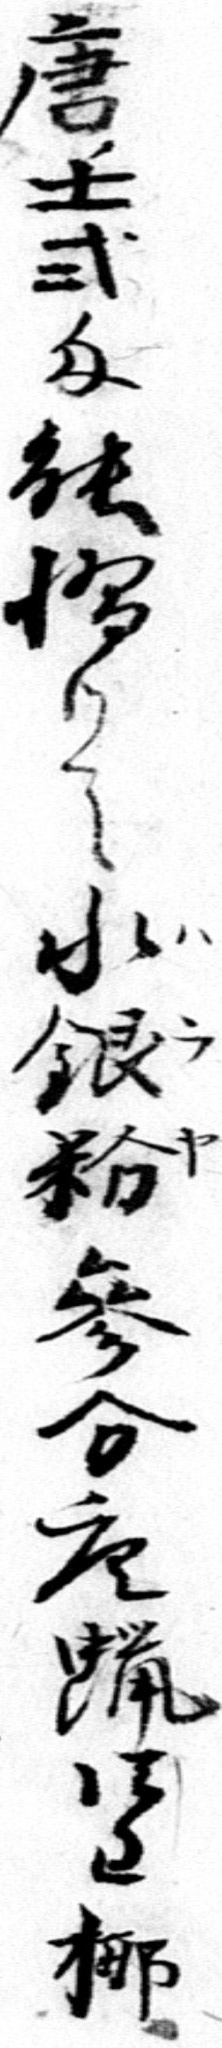唐の土弐匁能摺りて水銀粉参分唐蝋四匁椰
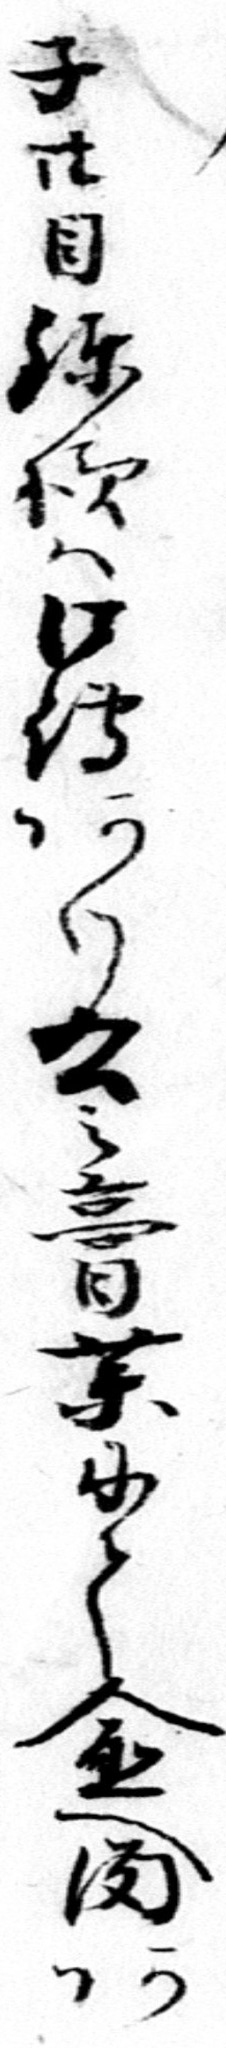子廿目錬様は口伝あり右の膏薬にて愈へ肉あ
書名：名薬秘伝之書
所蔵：徳島県立図書館
